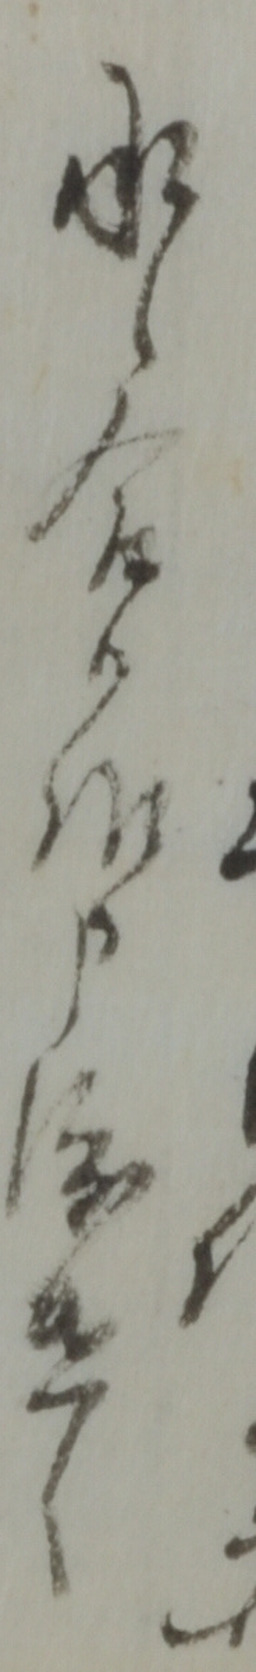承り合候様申渡遣候

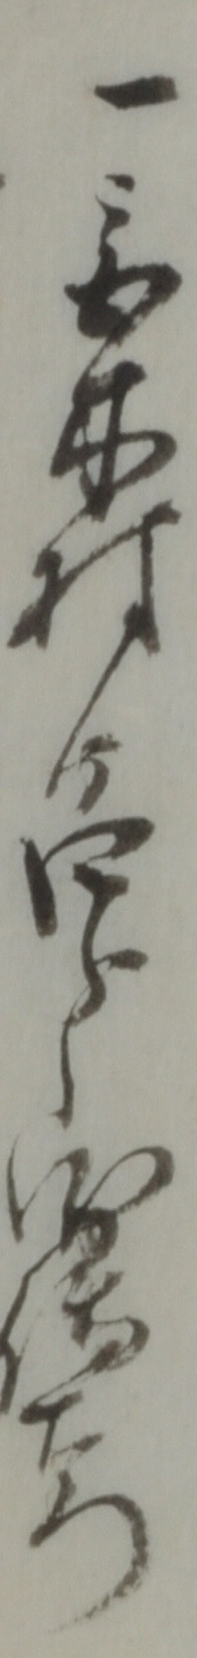一宮木村ゟ四郎兵衛伝右衛門
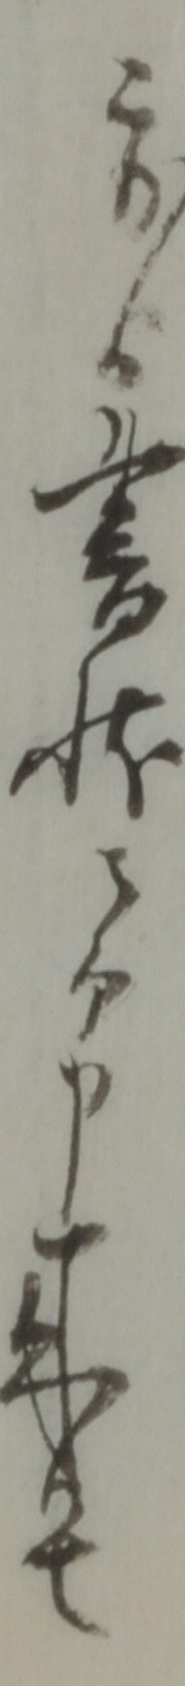方ゟ書状ニ而申来候は
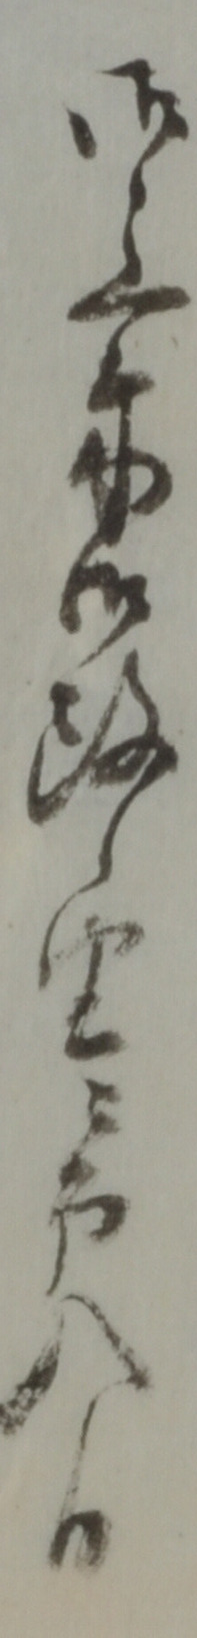御上米御改之由ニ而八日
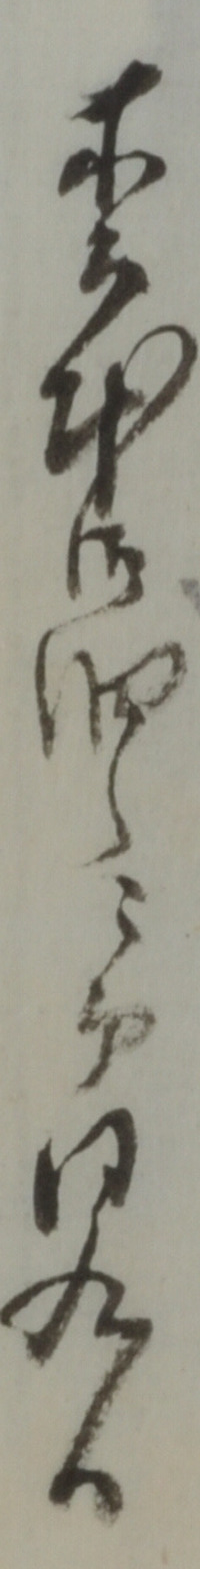松本御泊りニ而同九日
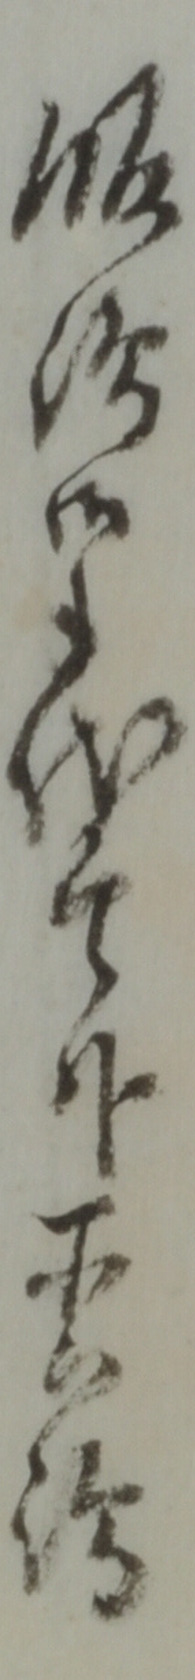飯嶋御丁代之外松嶋
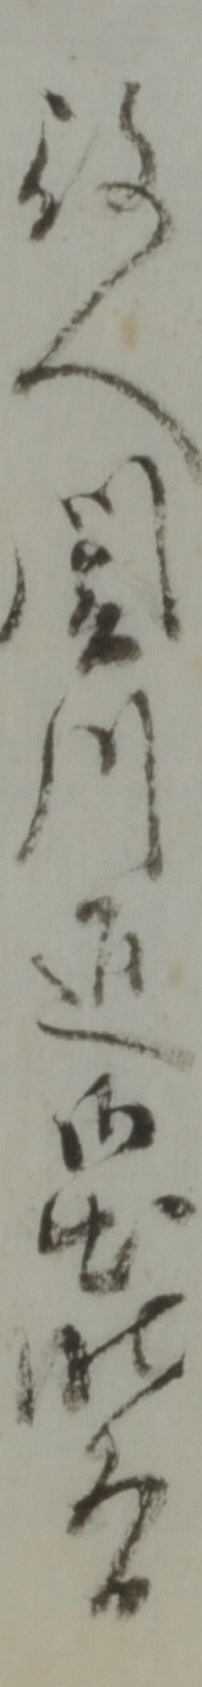役人関川迄御出昨五日
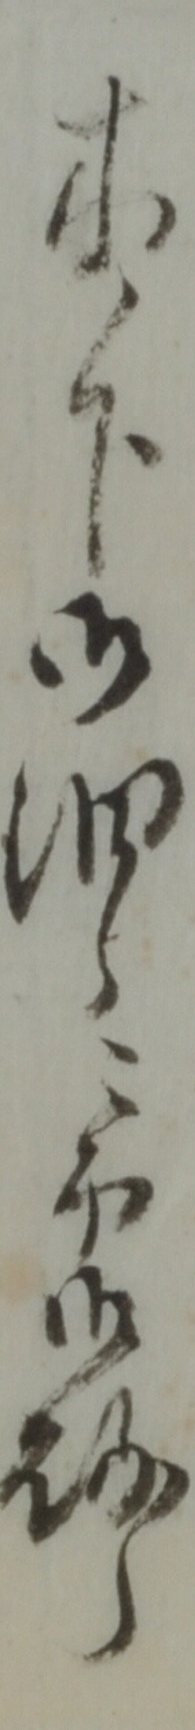木ノ下御泊りニ而御帰り
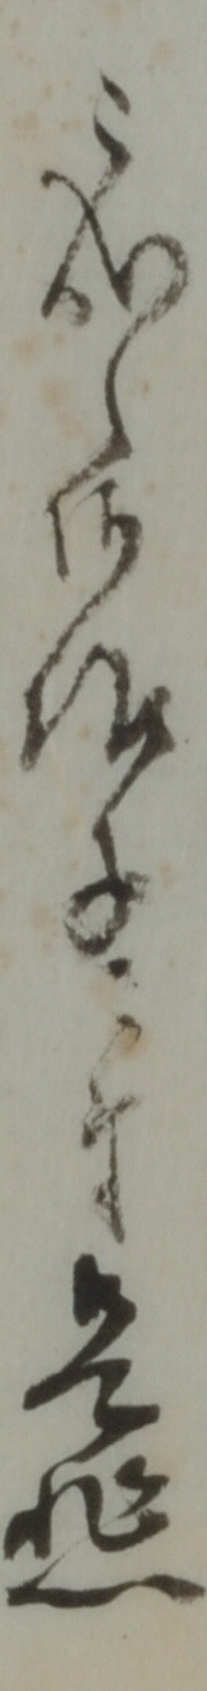被成候御様子ニ付是悲
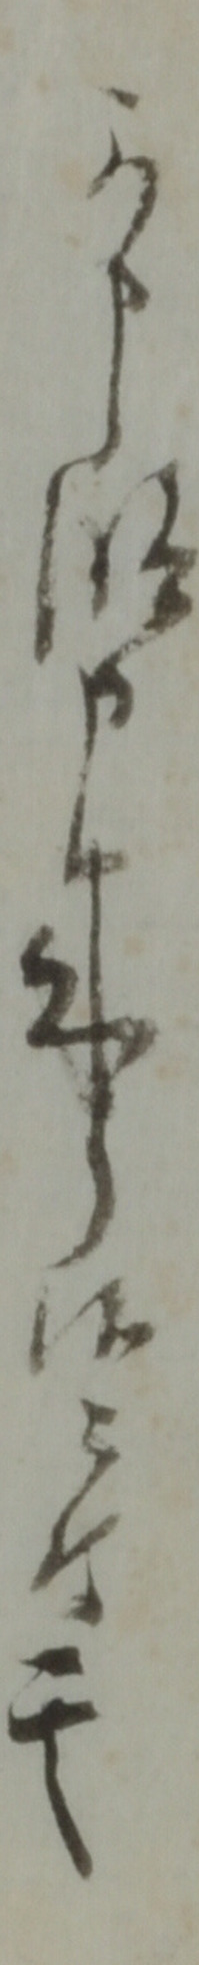可申段申来り候ニ付其
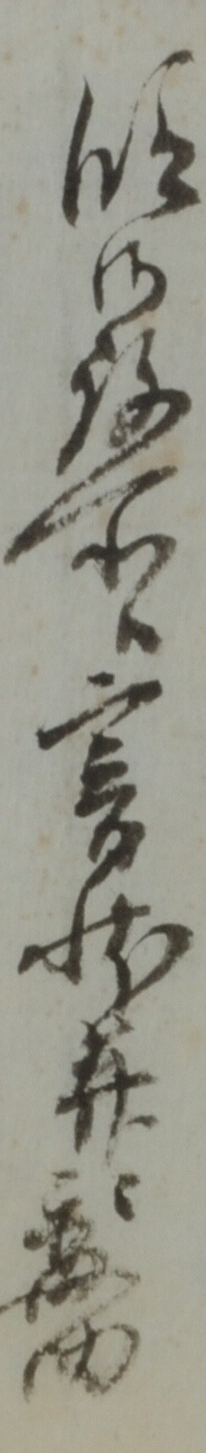段御役所え実状并ニ委細
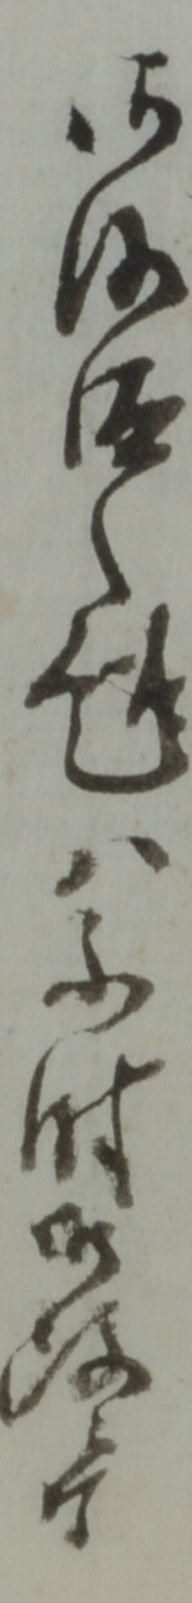御沙汰之趣ハ不時御改ニ付
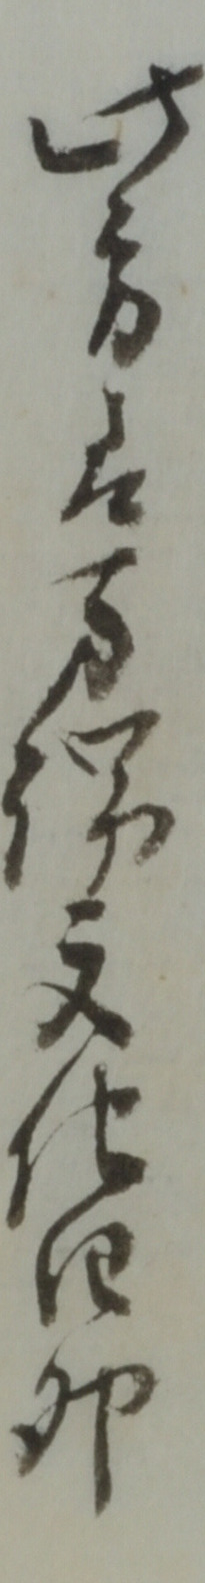此方は万端文化四卯
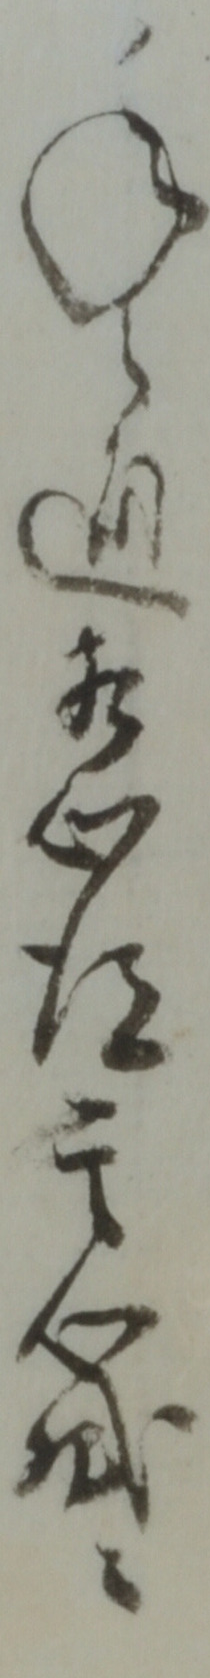年之通相心得其心掛ニ
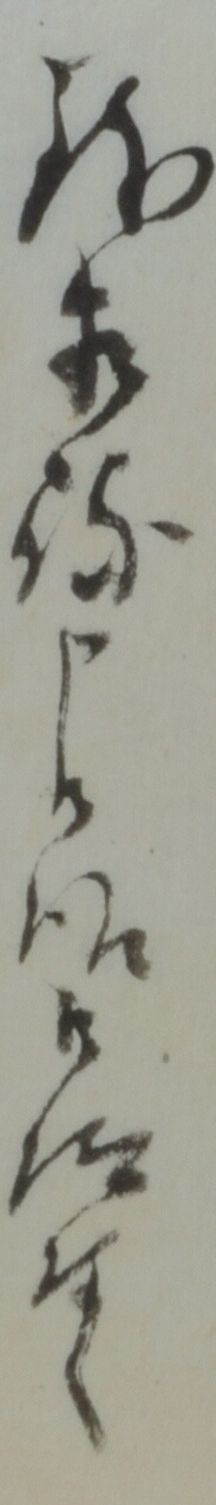致相待申候様被仰付候
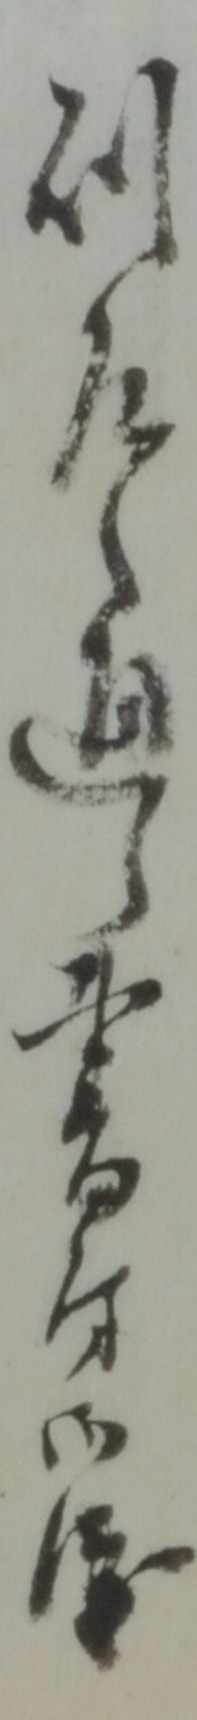則左之通り書付御渡
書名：御勘定御普請役江戸御役人様諸事控
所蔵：伊那市立高遠町図書館・合同会社AMANE
